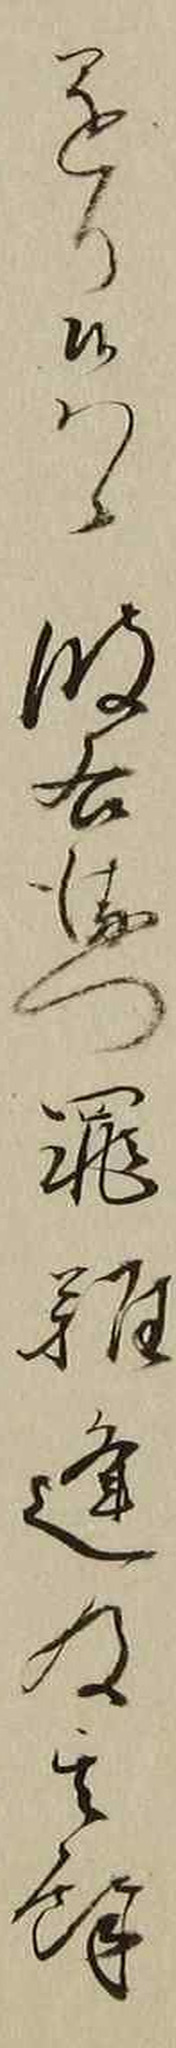懸り候はゝ段右衛門罪難逢為其餘
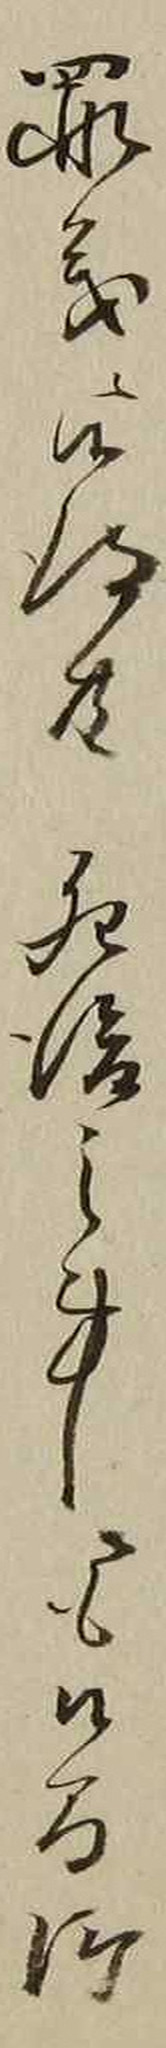罪義に候得共死後之事にも候間御
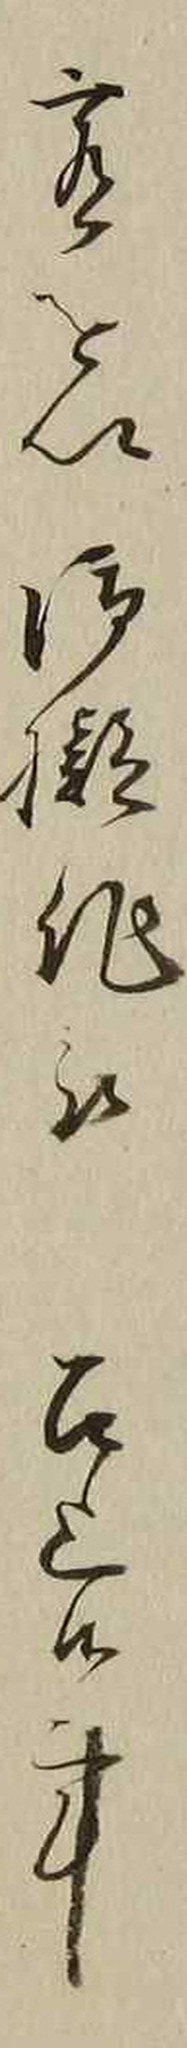宥を以御擬作被召上候事
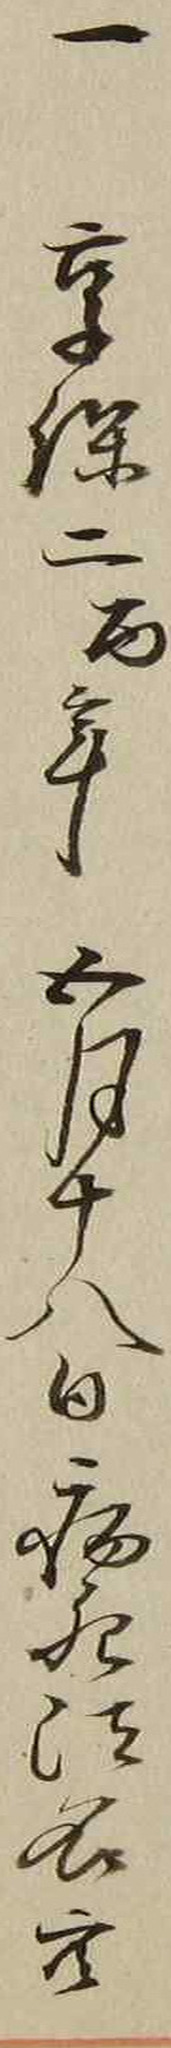一享保二酉年五月十八日病死法名空
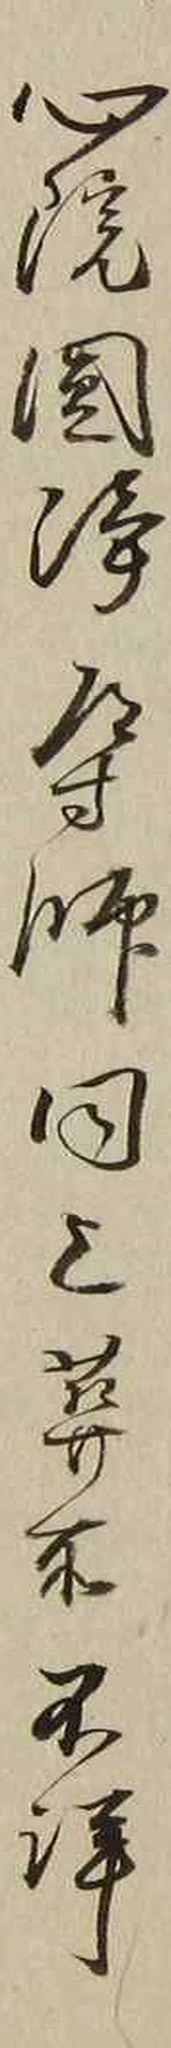心院園浄導師同上葬所不詳
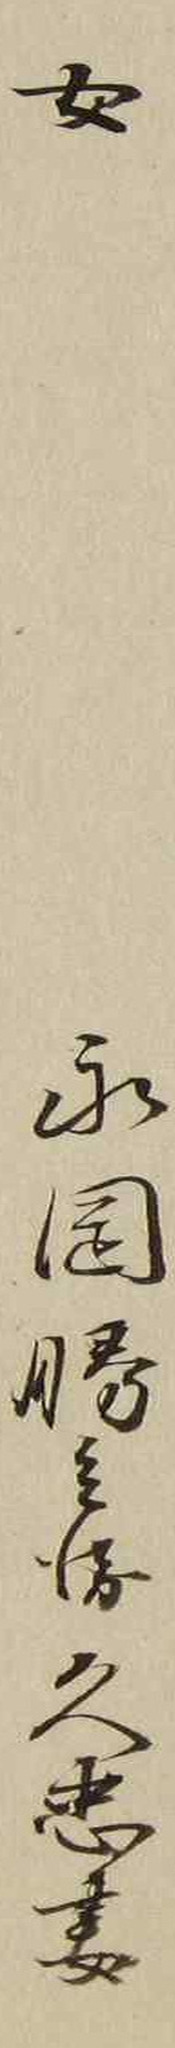女永岡勝兵衛久忠妻
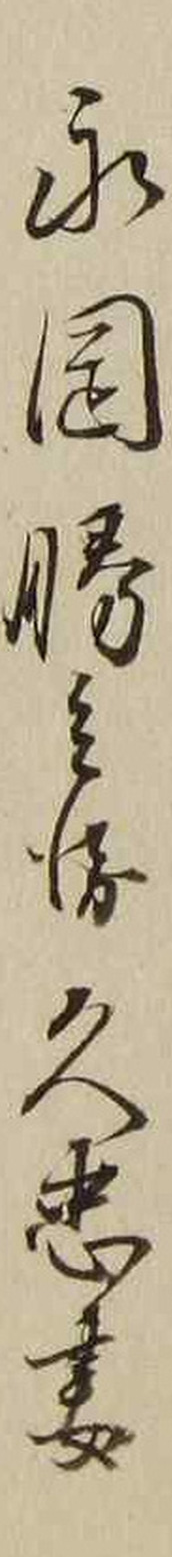女永岡勝兵衛久忠妻
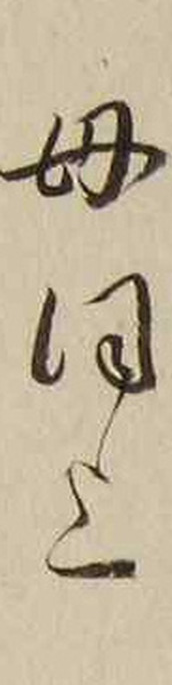母同上

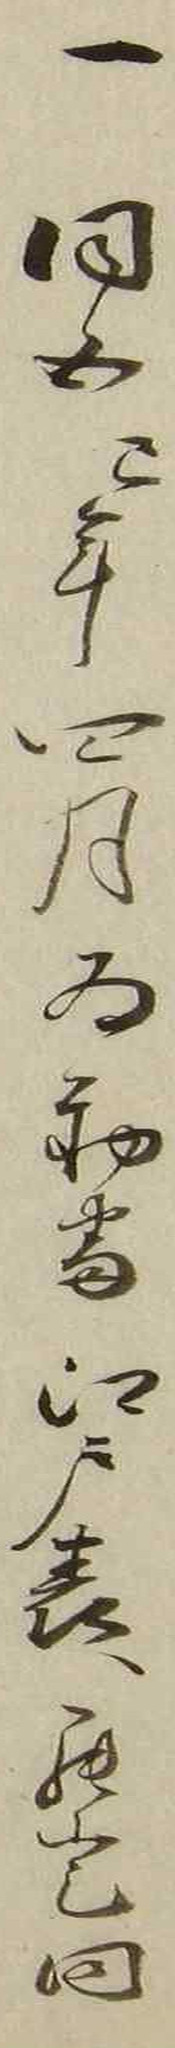一同五巳年四月為勤番江戸表へ罷登同
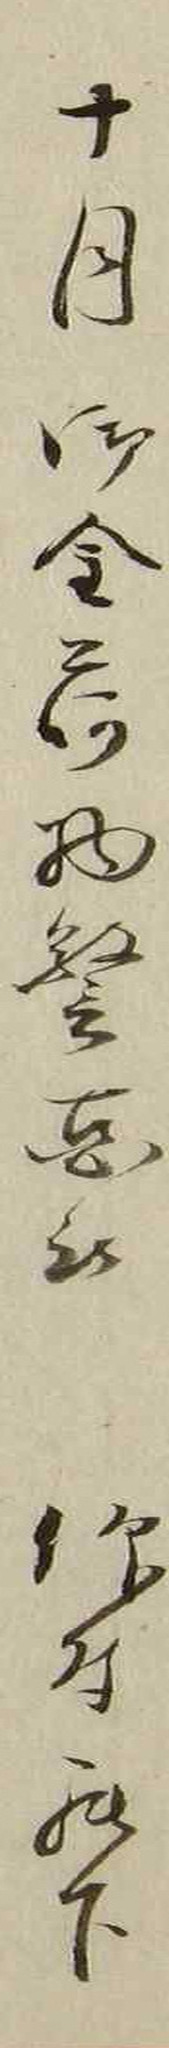十月御金荷物警護被仰付罷下
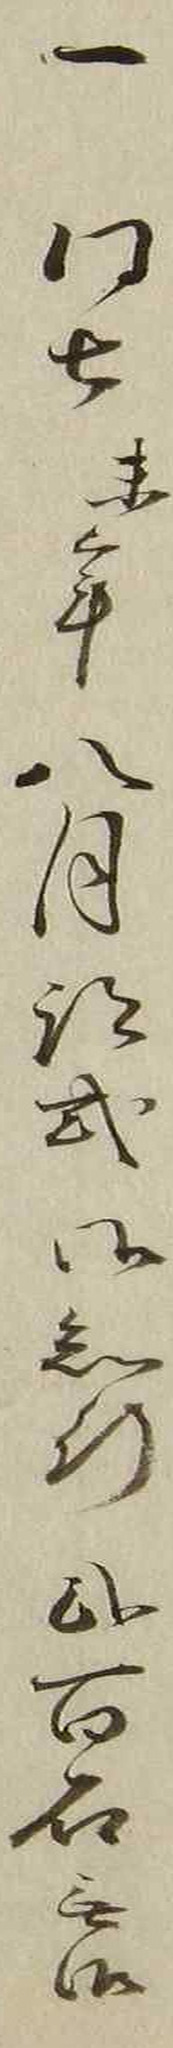一同七未年八月跡式御知行二百石無御
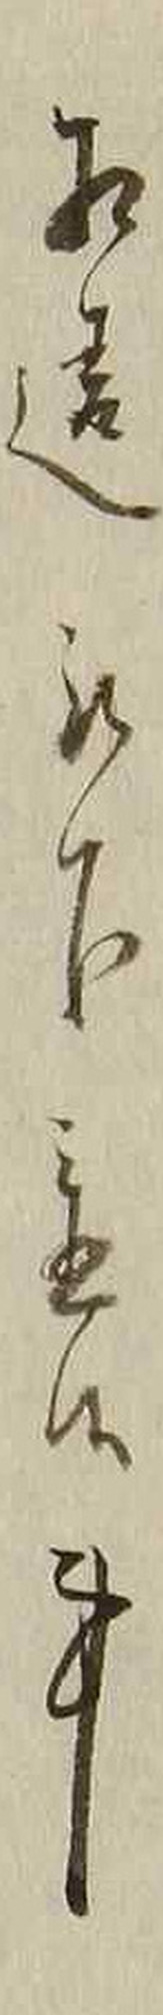相違被下置候事
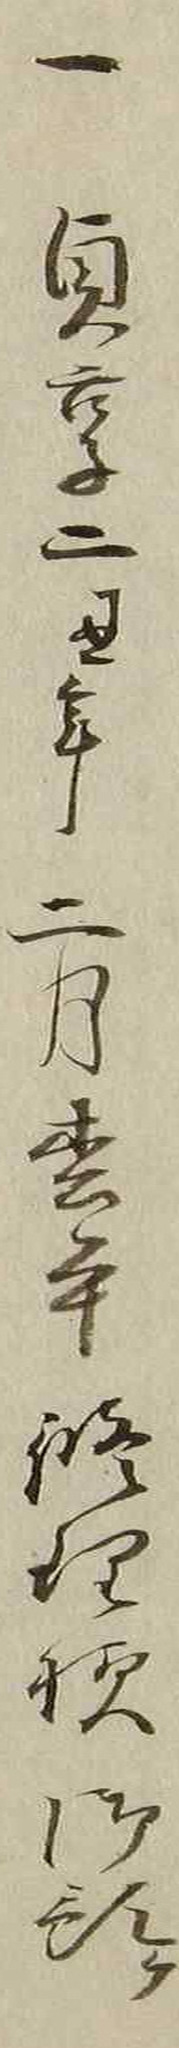一貞享二丑年二月松平修理様御預ヶ
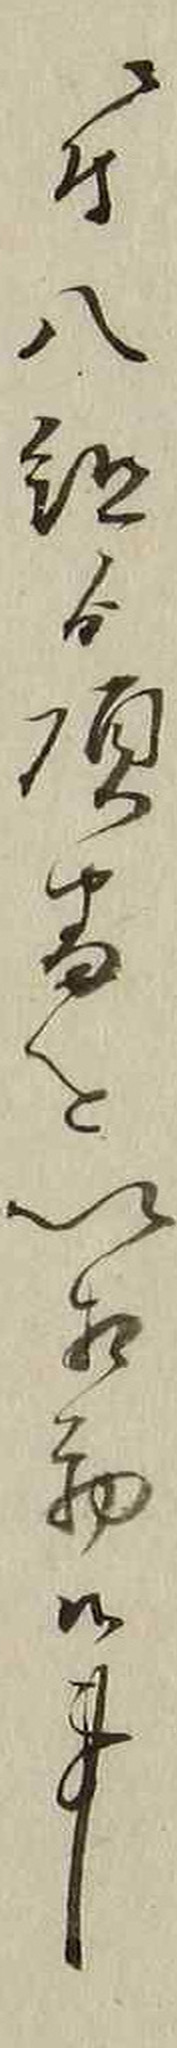に付八組ゟ頭番を以相勤候事
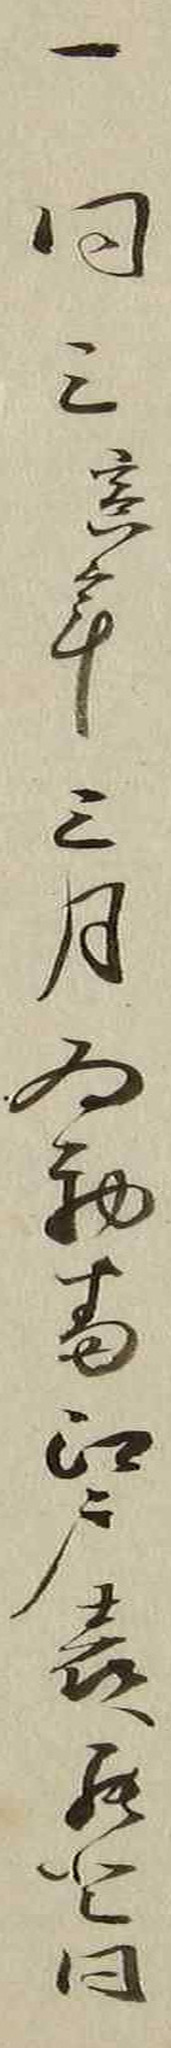一同三亥年三月為勤番江戸表へ罷登同
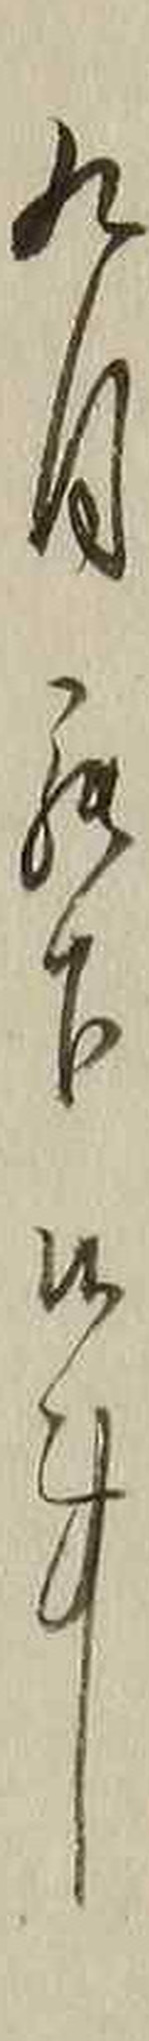九月罷下候事
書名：諸士系譜　巻之170　な之部12
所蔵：会津若松市立会津図書館
